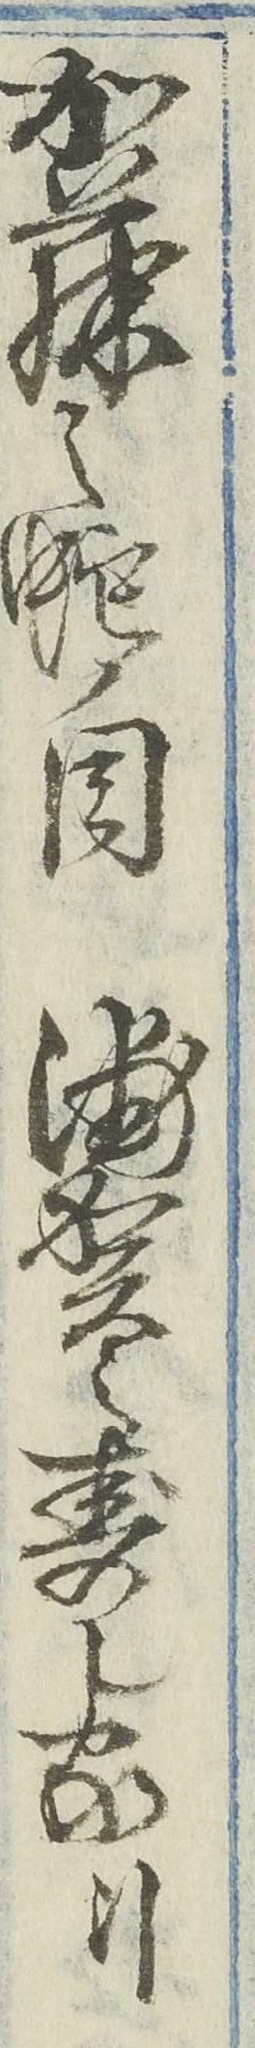加藤之蛇ノ目浦賀之寿シ家
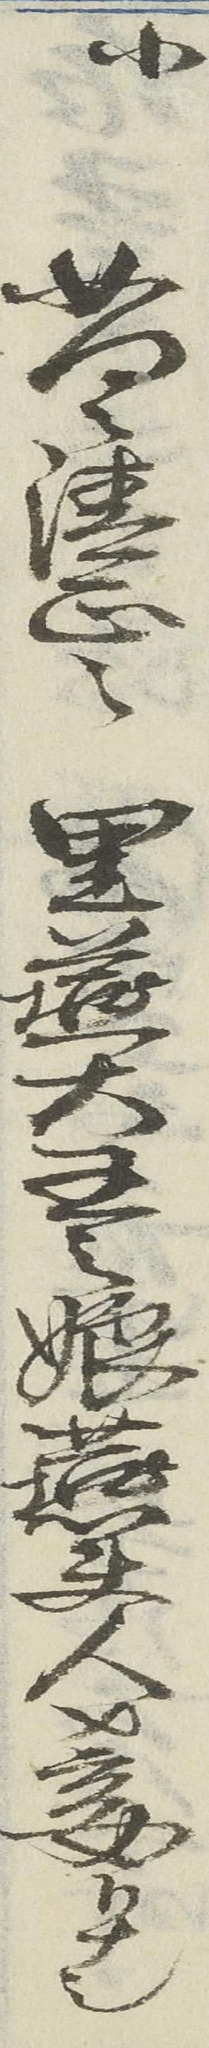小如何ニ清正ニ里燕大王之娘燕夫人ヲ妾トナシ
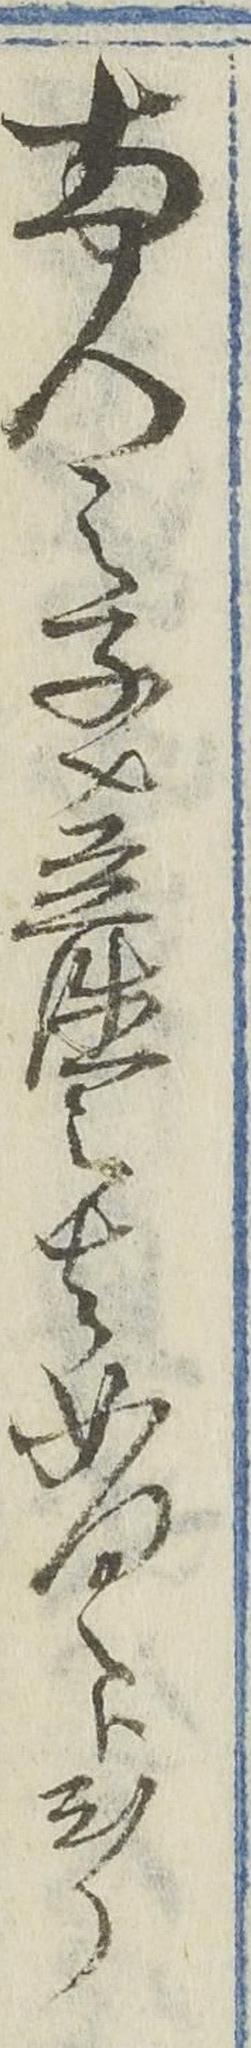両人之子ヲ産シは如何ニト云ウ

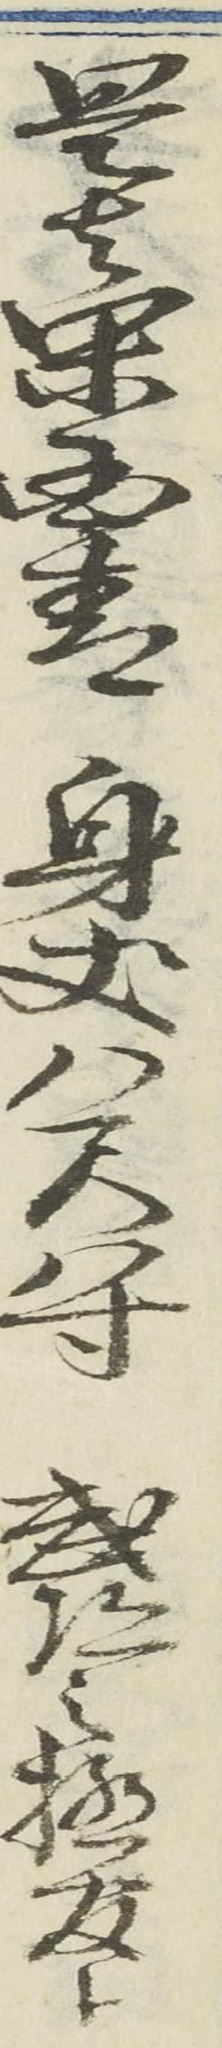是は果国青身丈八尺八寸武道之極官ト
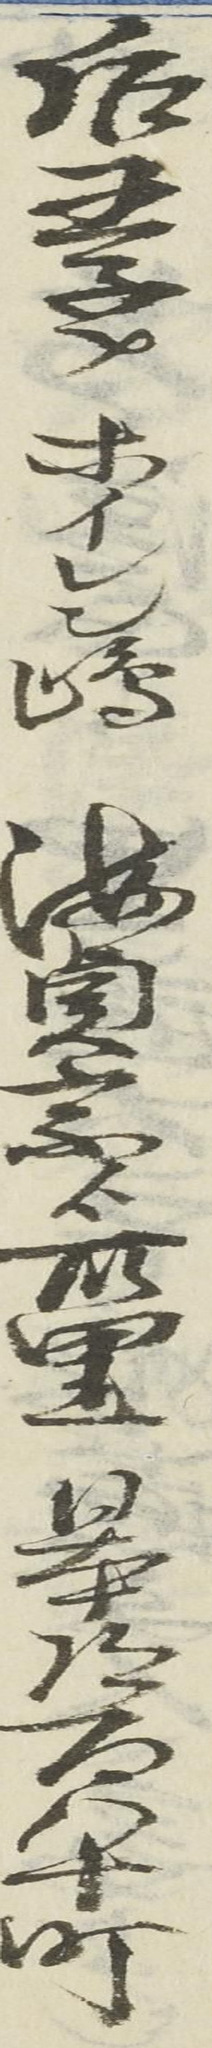后王子ヲホイレン島海貞宗ゟ丗里日本道百八十町
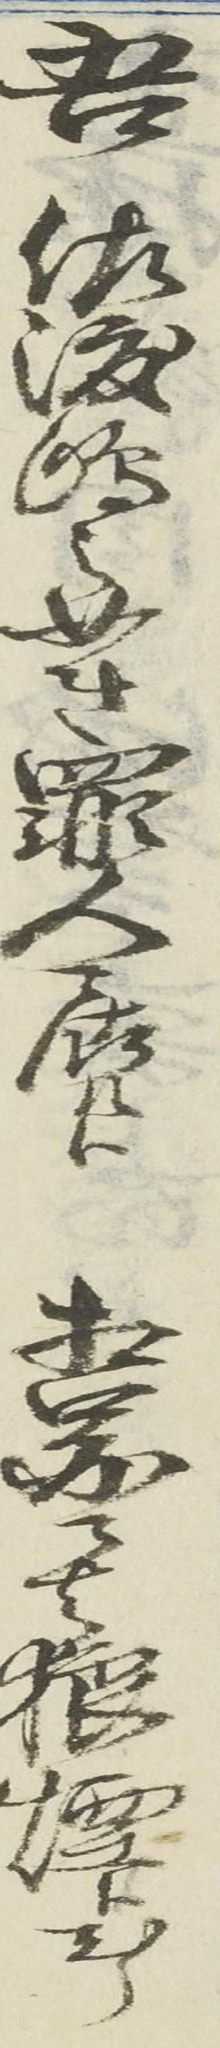吾佐渡島之如き罪人居ルト相図ニは狼煙ト云ウ
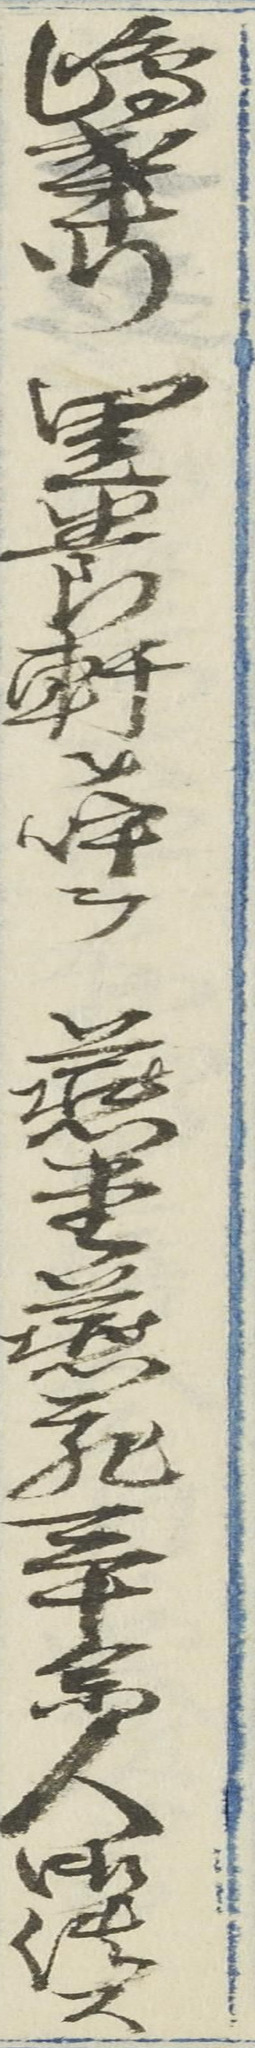島奉行里養軒ヲ呼テ燕堂燕飛三十余人御供ス
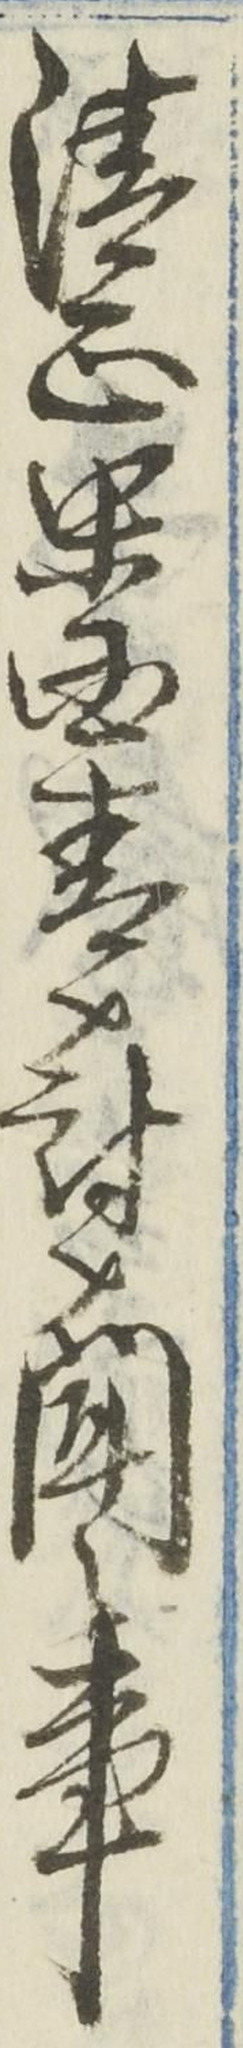清正果国青ヲ討ヲ聞之事
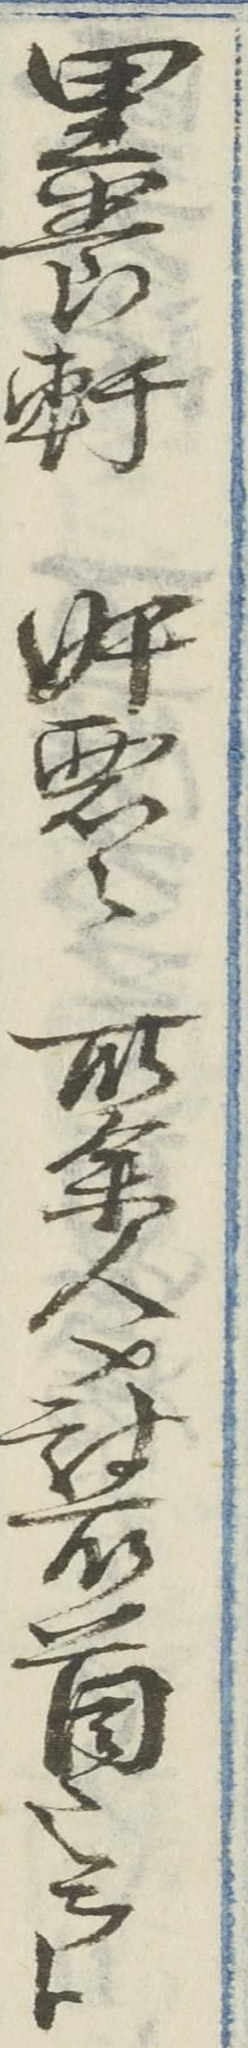里養軒奸悪也丗余人ヲ討取首ニシテト
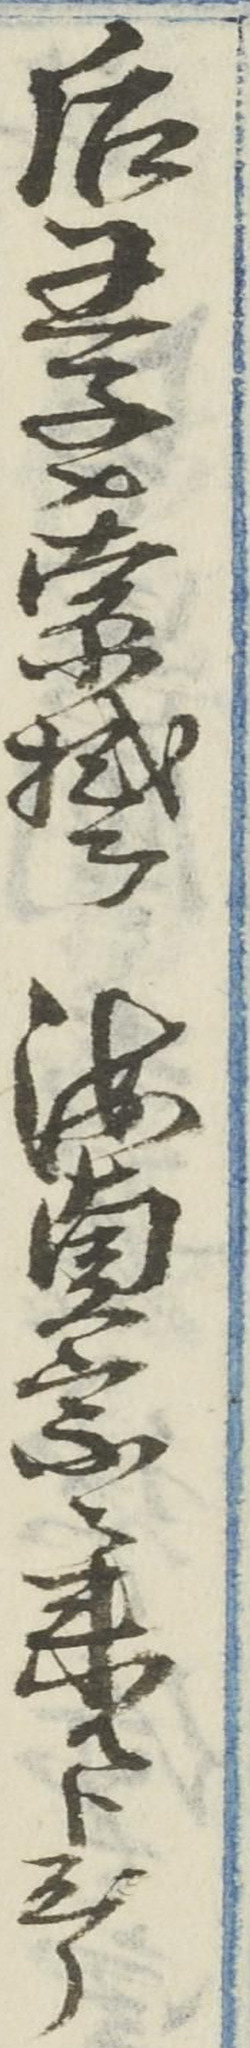后王子ヲ索掛テ海貞宗ニ来ルト云ウ
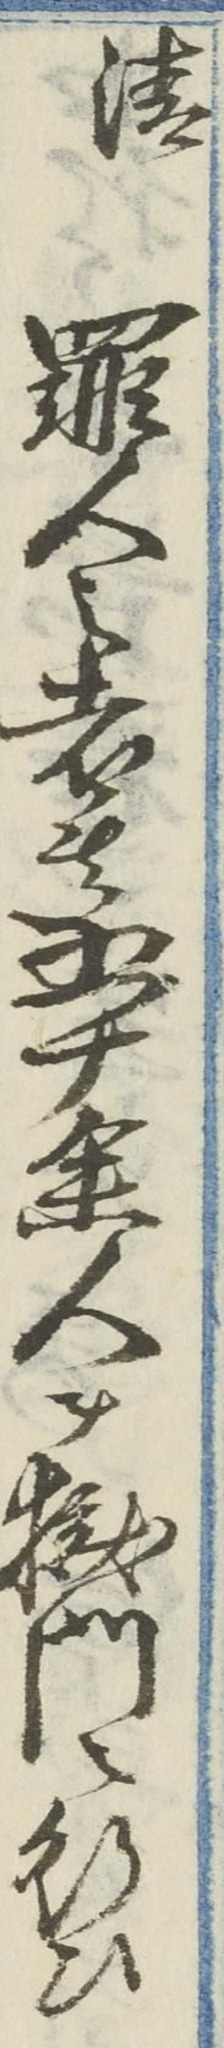清罪人之者共五十余人ヲ獄門ニ行ひ
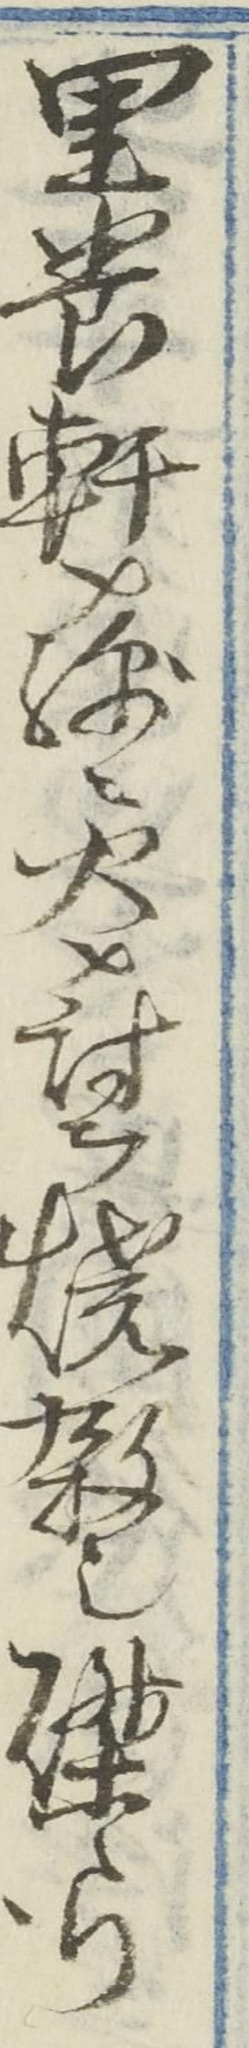里養軒ヲ綿ニ火ヲ討テ焼殺シ磔ニ行
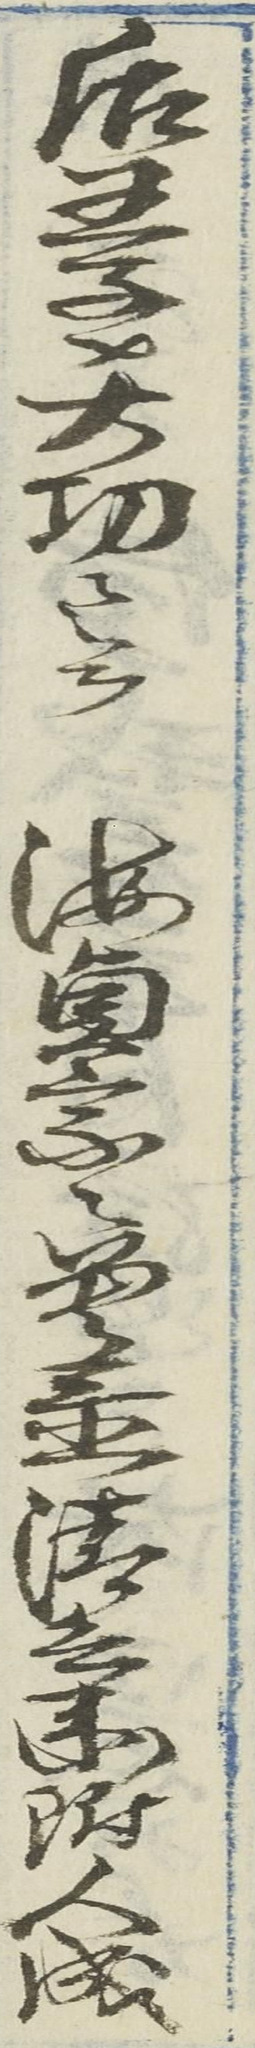后王子ヲ大切ニシテ海貞宗ニ差置清兵衛附人成
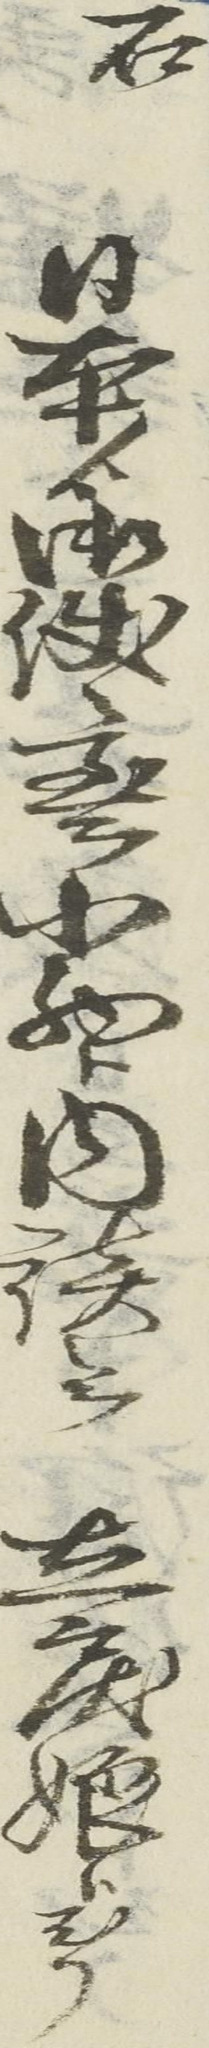石日本ゟ御使ニ至テ小西ト内談シテ立戻娘ト云ウ
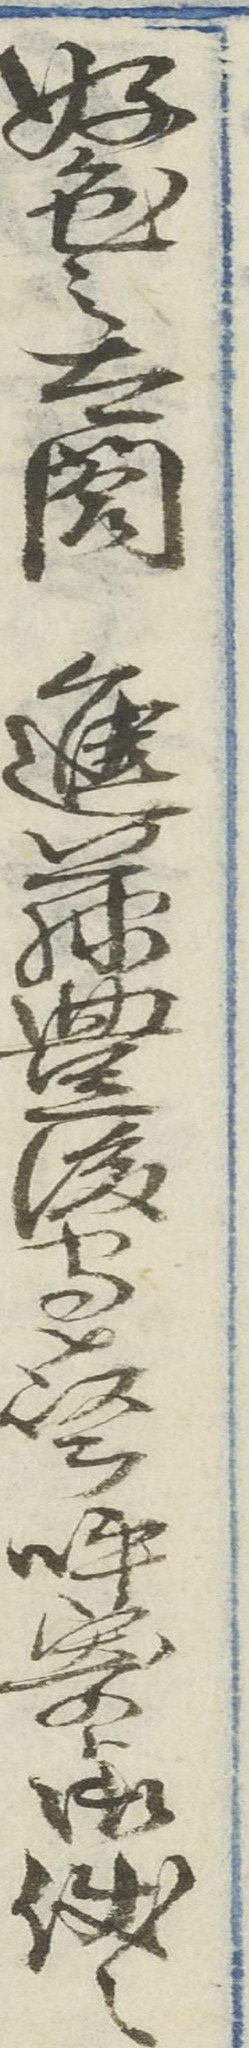好色之太閤進藤豊後守ヲ以テ呼寄ト御使ニ
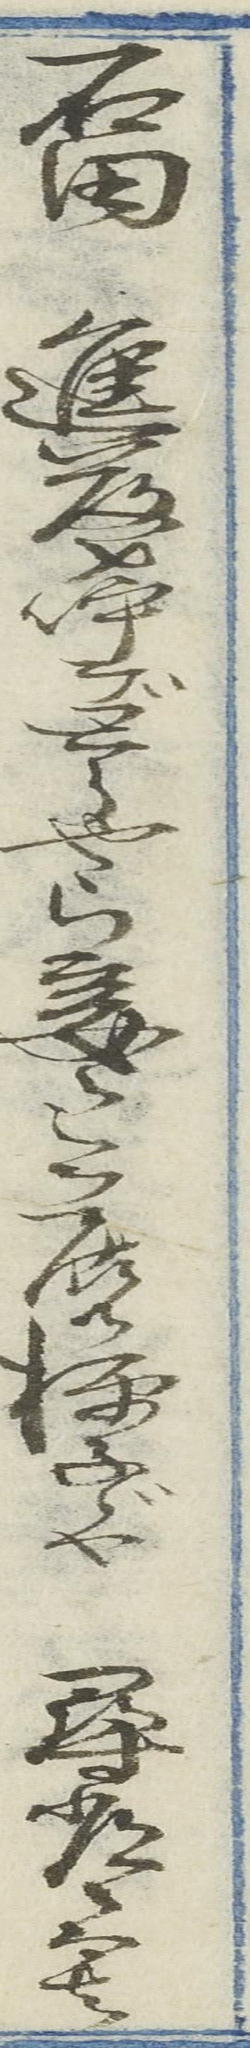石田進藤ヲ呼テどうやら妾ニシテ居ル様子ジヤ尋常ニ而は
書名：伏水大地震
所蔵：東京大学地震研究所図書室 Earthquake Research Institute Library, The University of Tokyo, JAPAN
